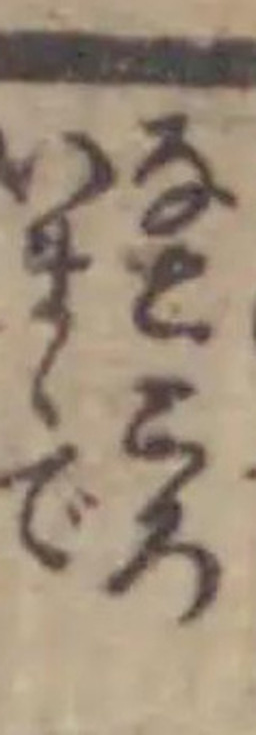いまゝで
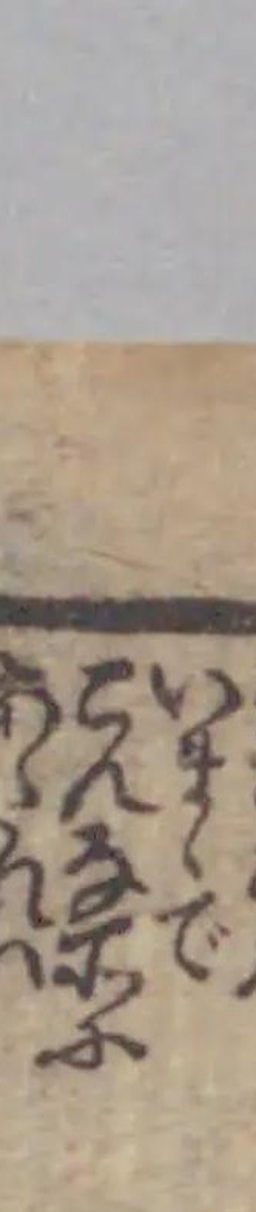こんな所に
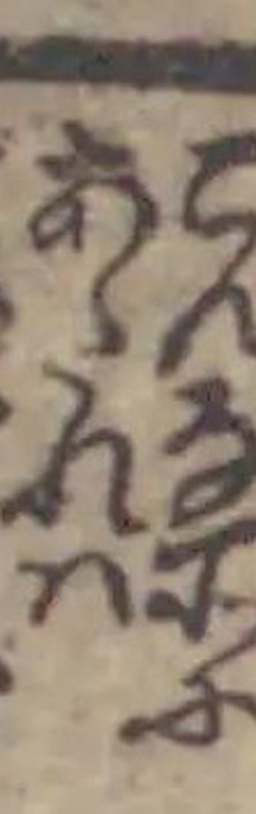あたれは
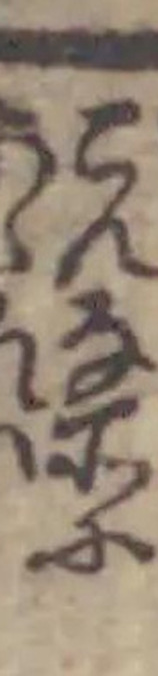こんな所に
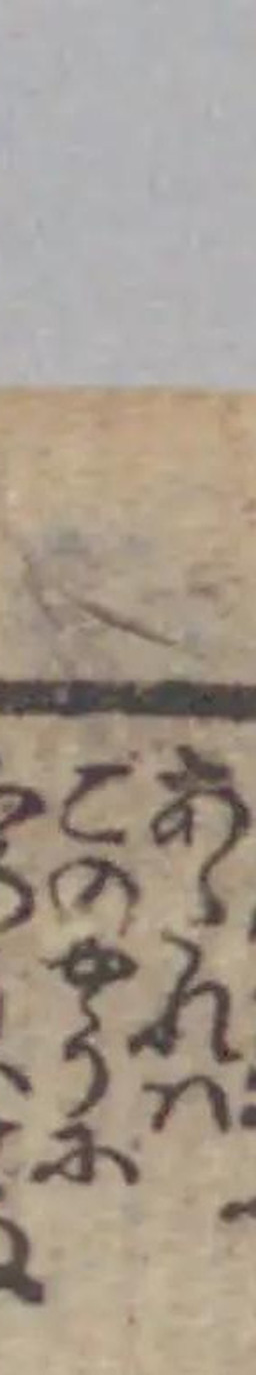このやうに
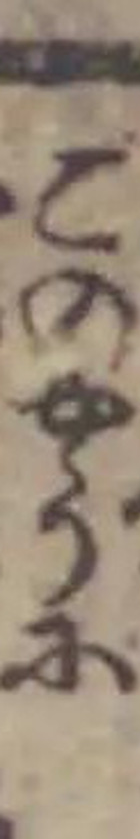このやうに
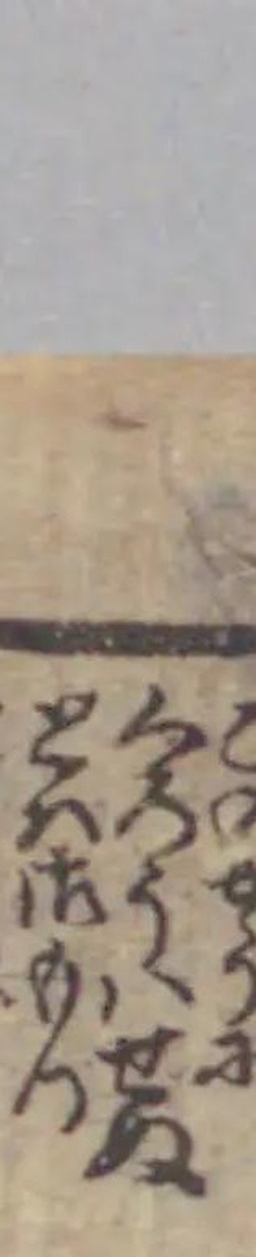とは御もつ
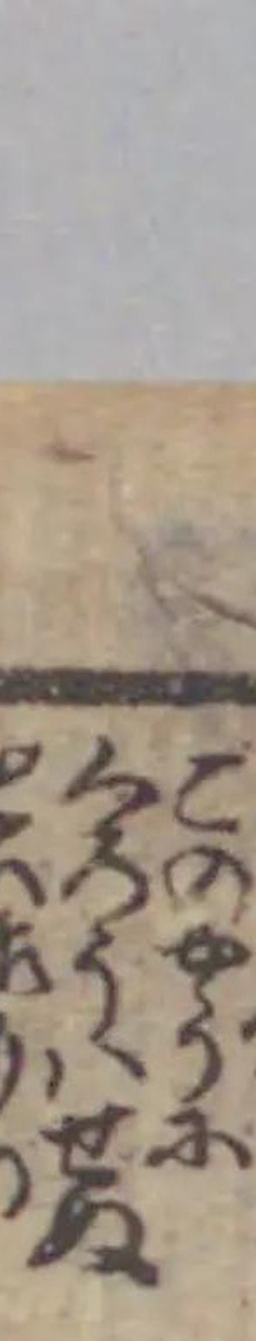くろうはせぬ
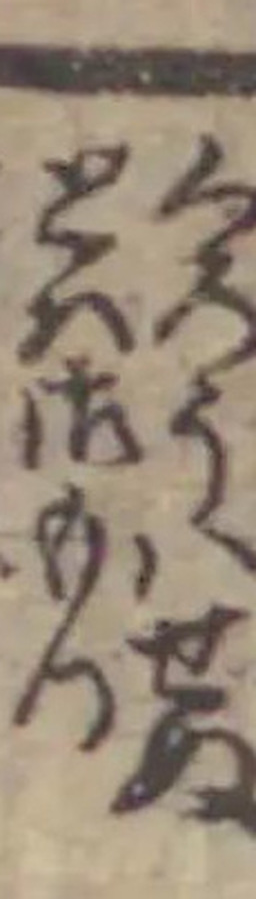とは御もつ
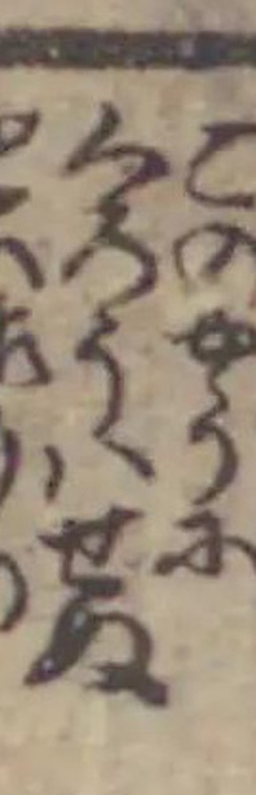くろうはせぬ
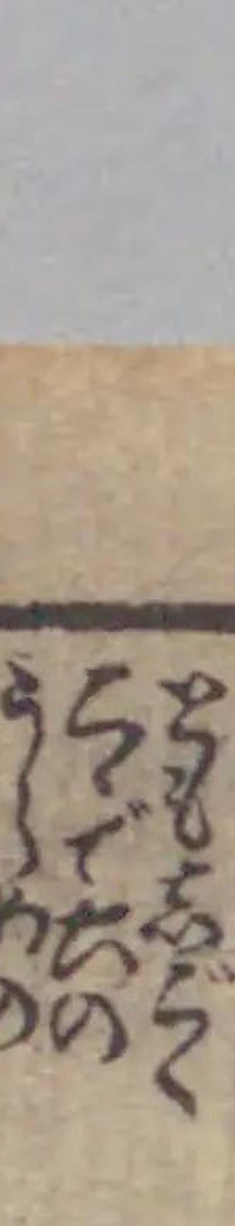こゝで六の
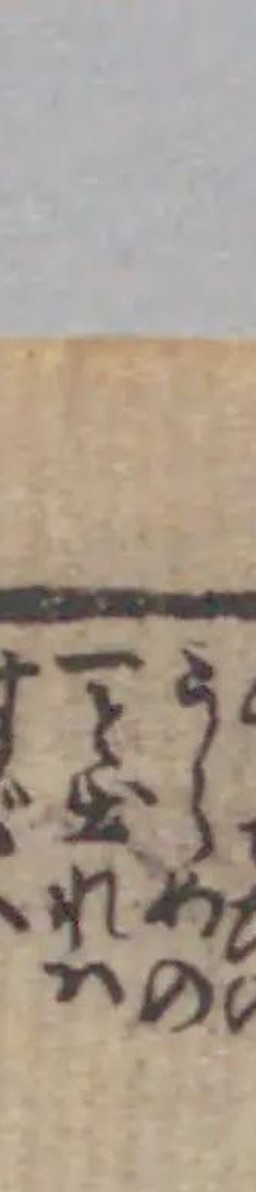一と出れば
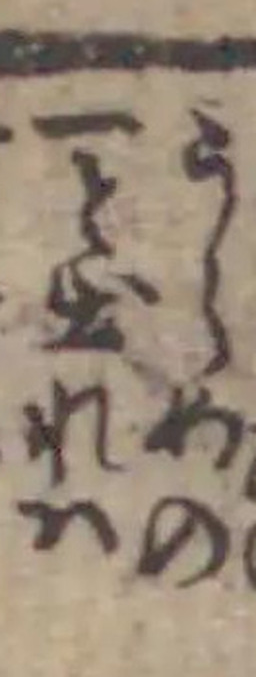一と出れば
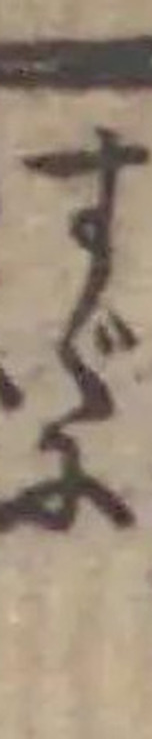すぐに
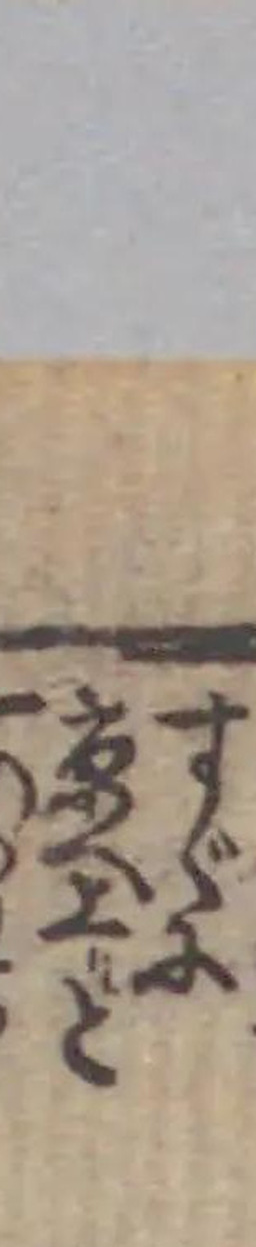京へ上ルと
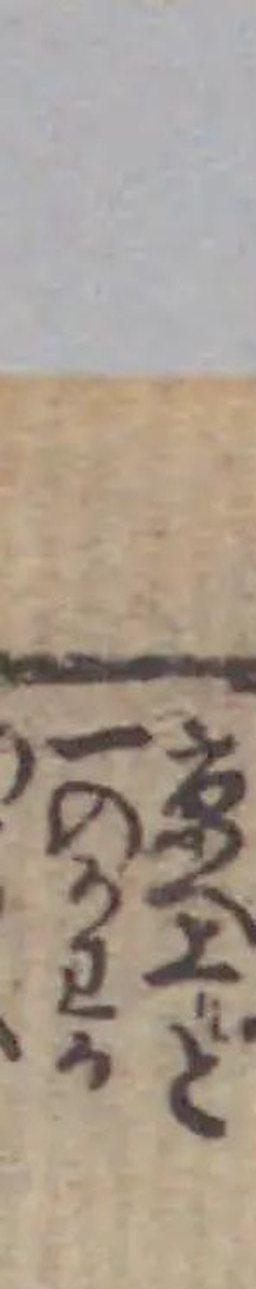一のかわか
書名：道笑双六
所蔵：国立国会図書館 National Diet Library, JAPAN
